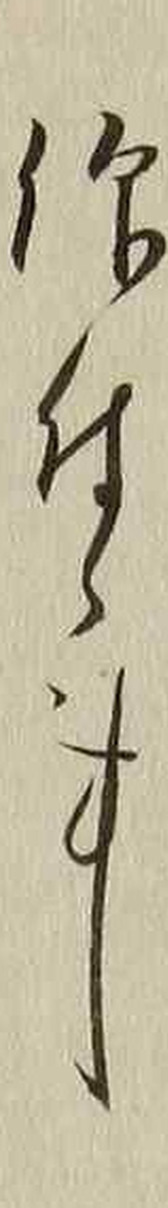仰付候事
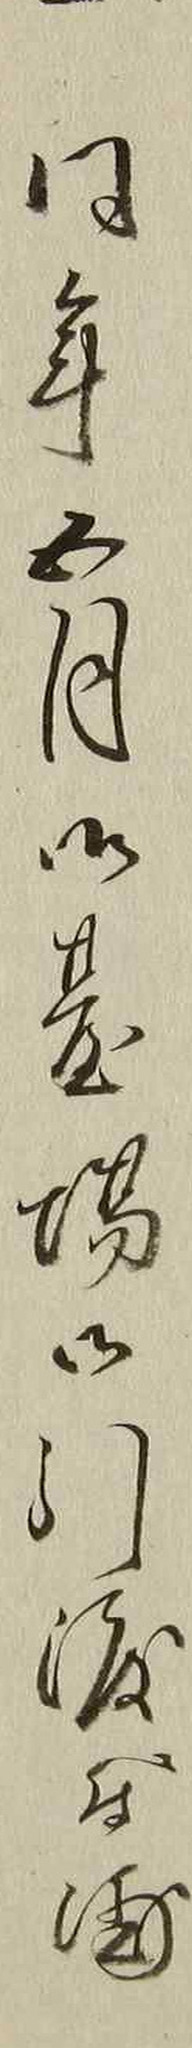一同年五月御台場御引渡ニ付浦
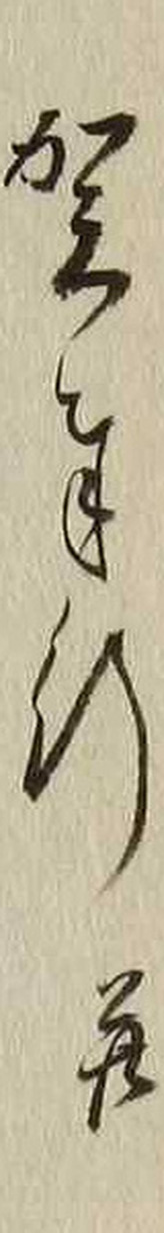賀奉行幷
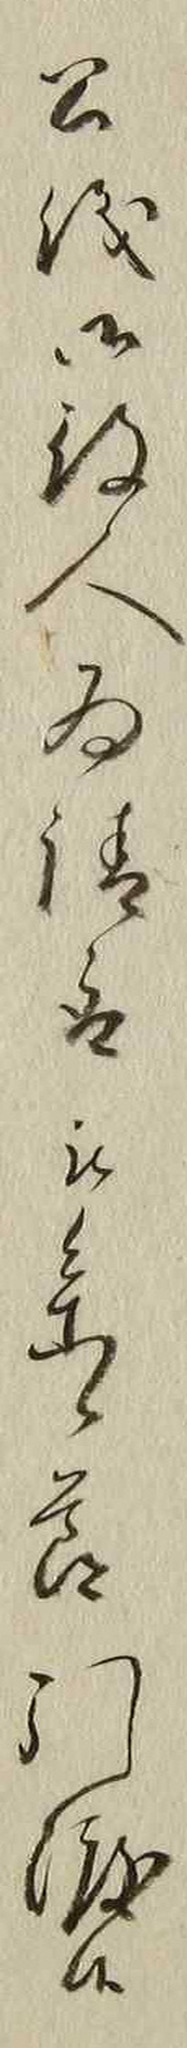公儀御役人為請取被参候節引渡候
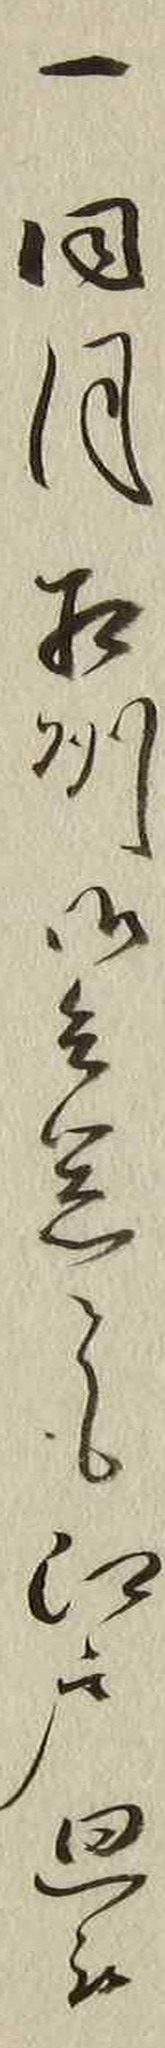一同月相州御兵器とも江戸廻被
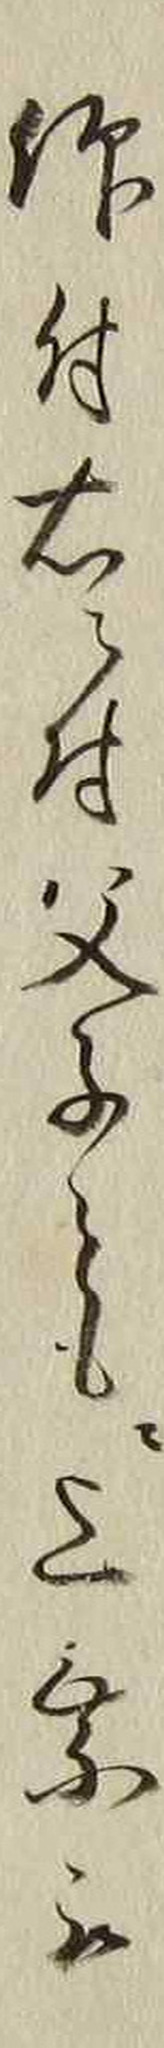仰付右ニ付父子ともニ上乗被
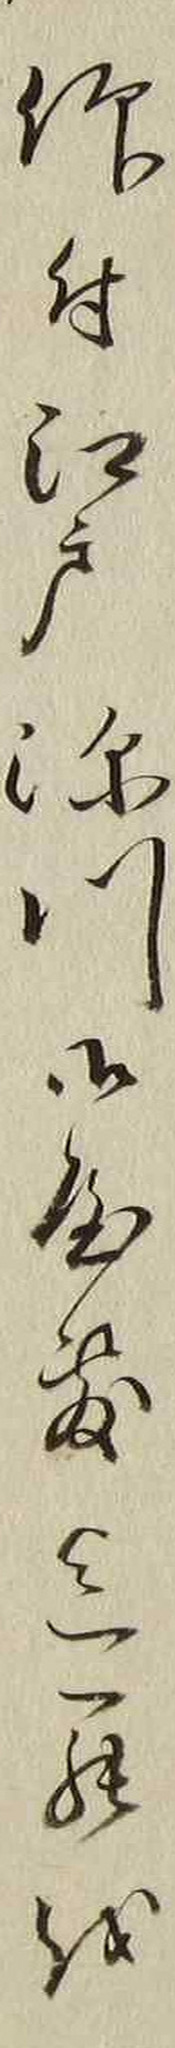仰付江戸深川御屋敷迄罷越
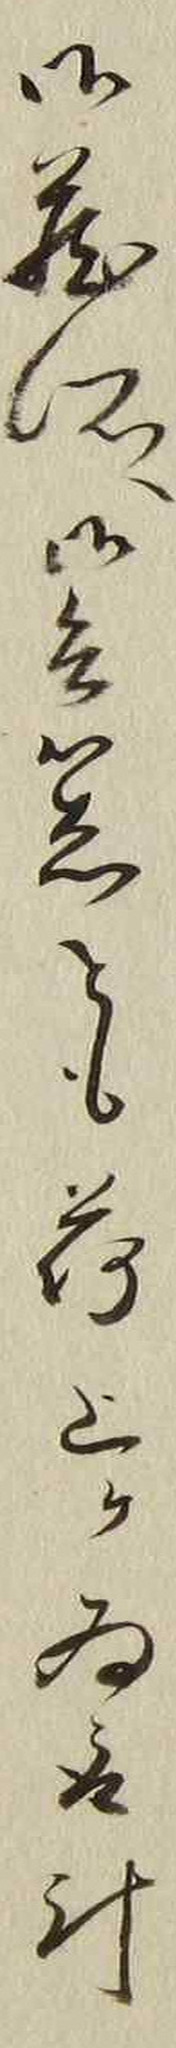御蔵所へ御兵器とも荷上ヶ為取計
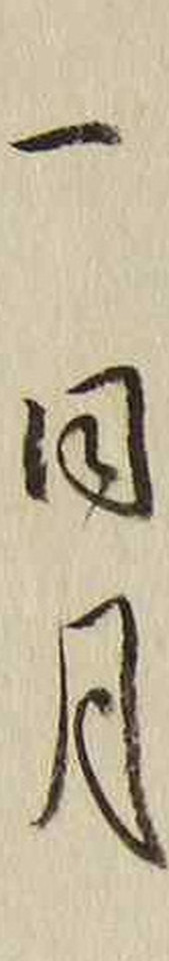一同月
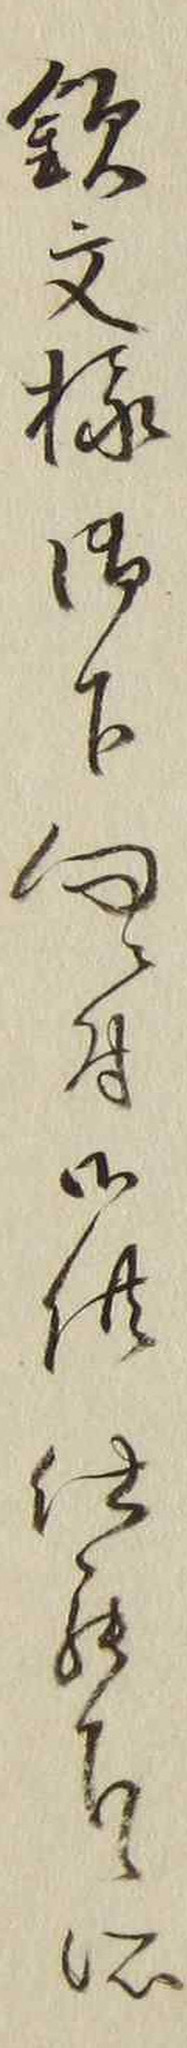欽文様御下向ニ付御供仕罷下候所

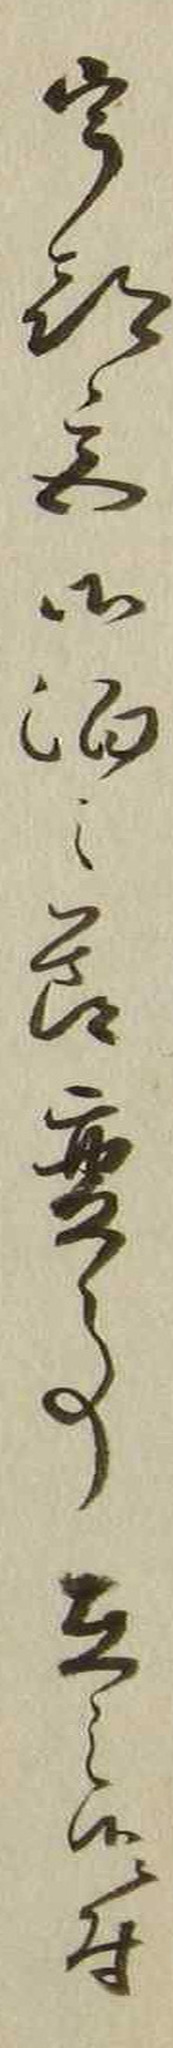宇都宮御泊之節変事在之候ニ付
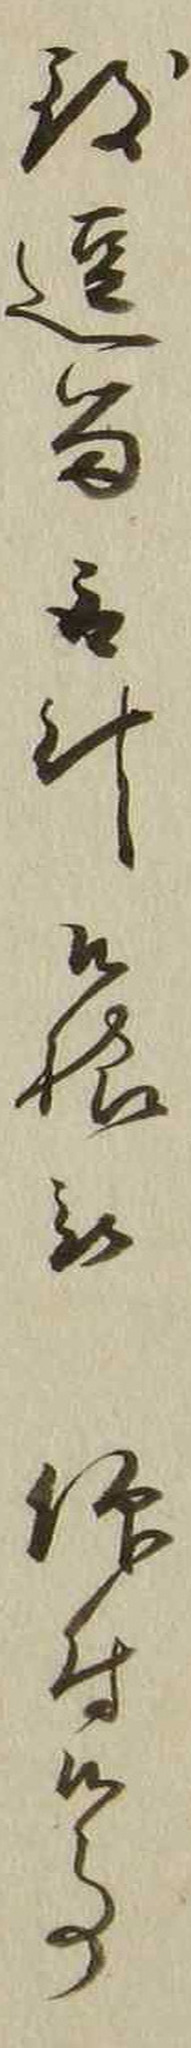致逗留取計候様被仰付候事
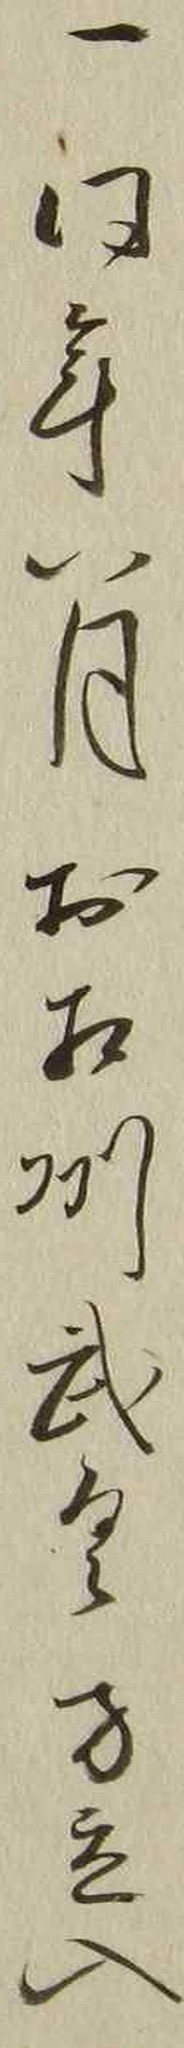一同年八月於相州武具方立入
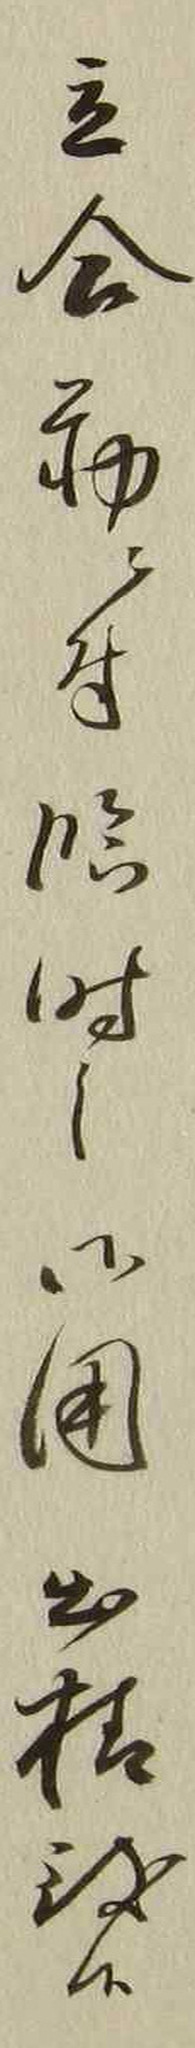立合勤ニ付臨時之御用出精致候
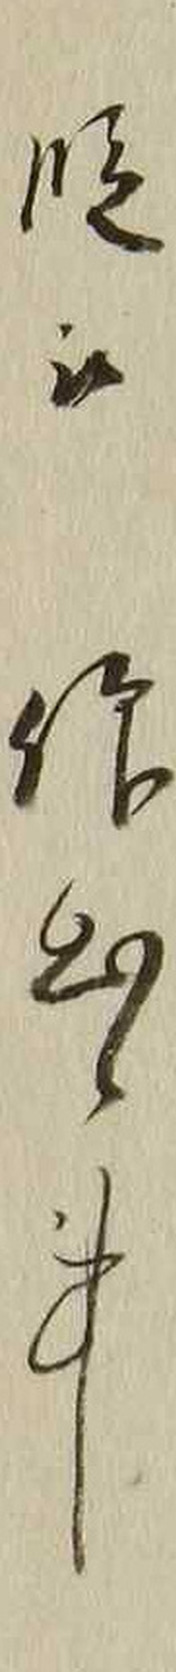段被仰出候事
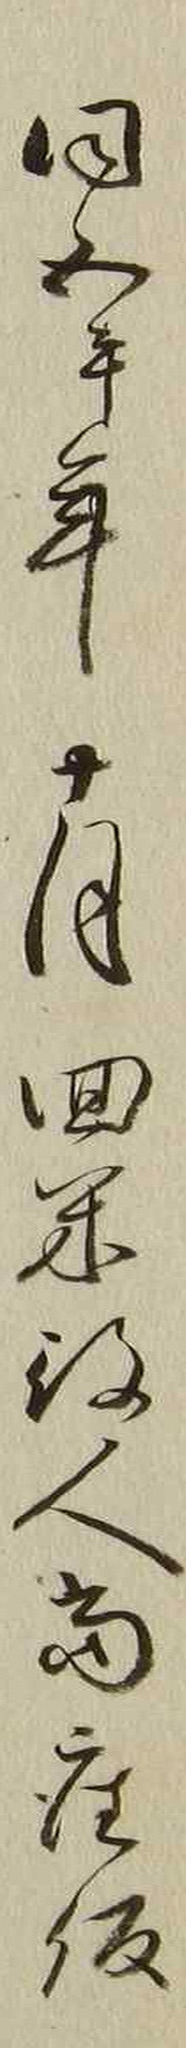一同五午年十月廻米役人当座仮
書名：諸士系譜　巻之52　に之部3
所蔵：会津若松市立会津図書館
